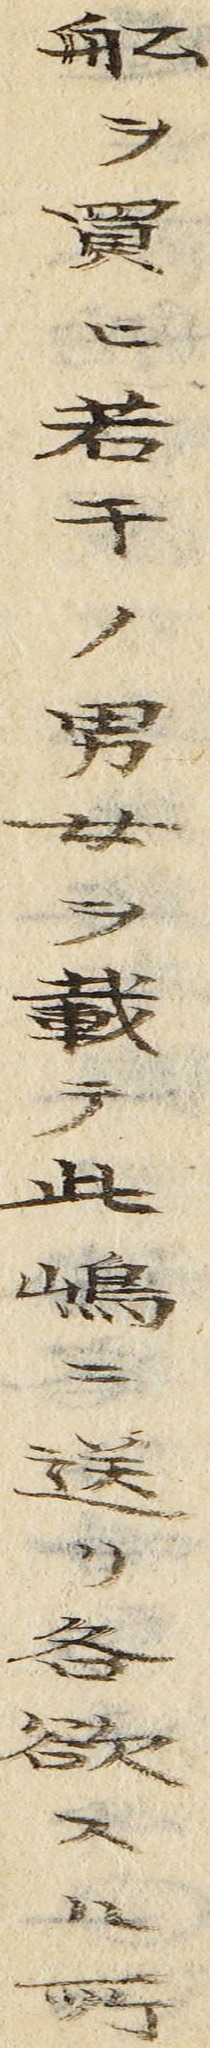船ヲ買ヒ若干ノ男女ヲ載テ此嶋ニ送リ各欲スル所
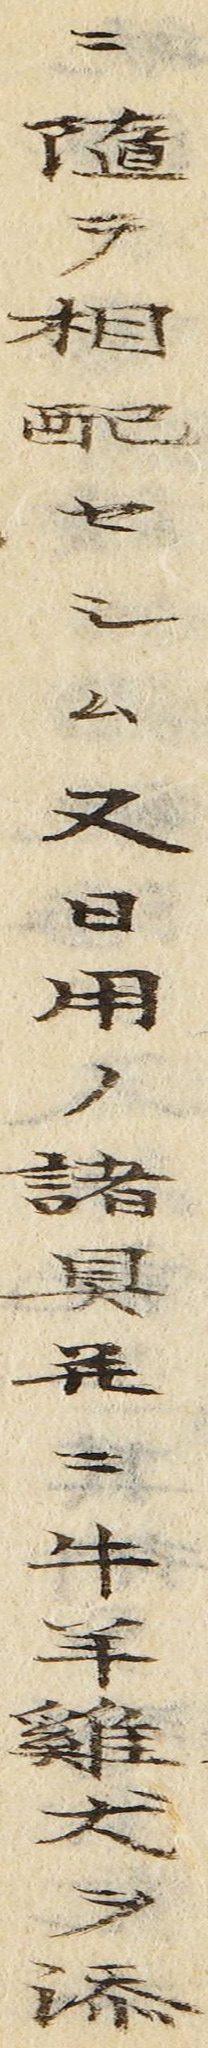ニ随テ相配セシム又日用ノ諸具并ニ牛羊鶏犬ヲ添
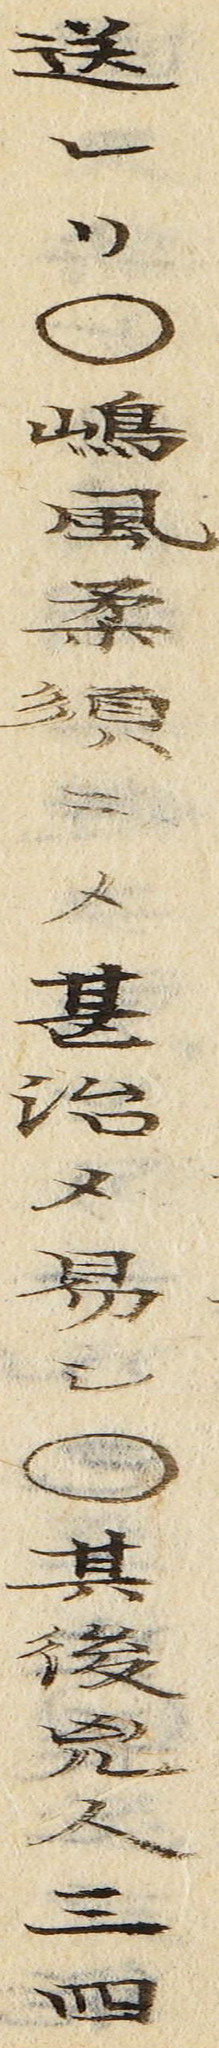送レリ◯嶋風柔須ニシテ甚治メ易シ◯其後兇人三四
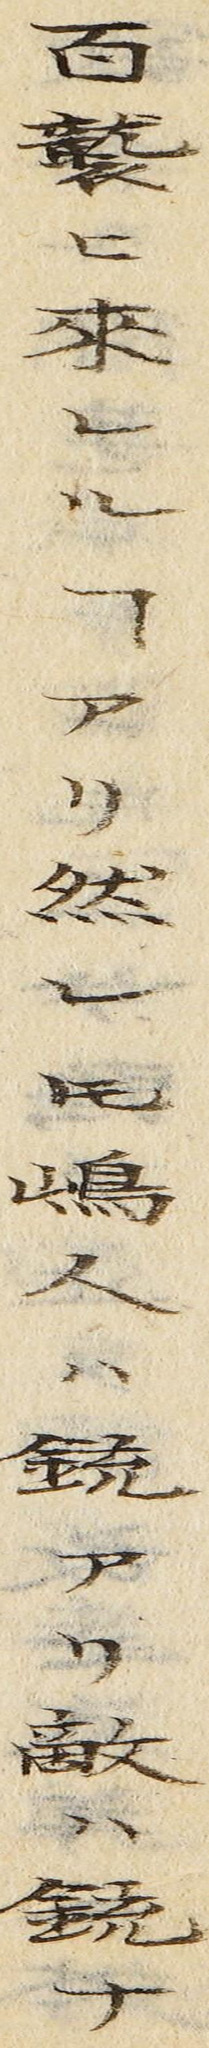百襲ヒ来レルコトアリ然レトモ嶋人ハ銃アリ敵ハ銃ナ
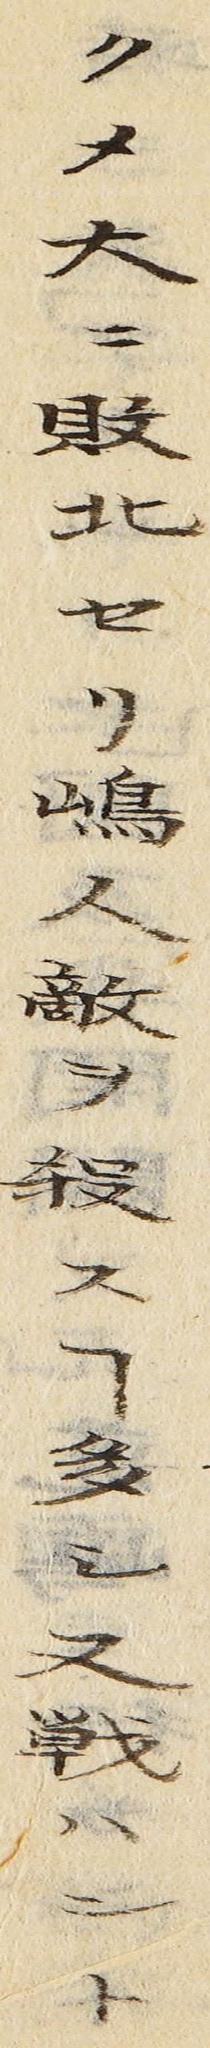クシテ大ニ敗北セリ嶋人敵ヲ殺スコト多シ又戦ハント
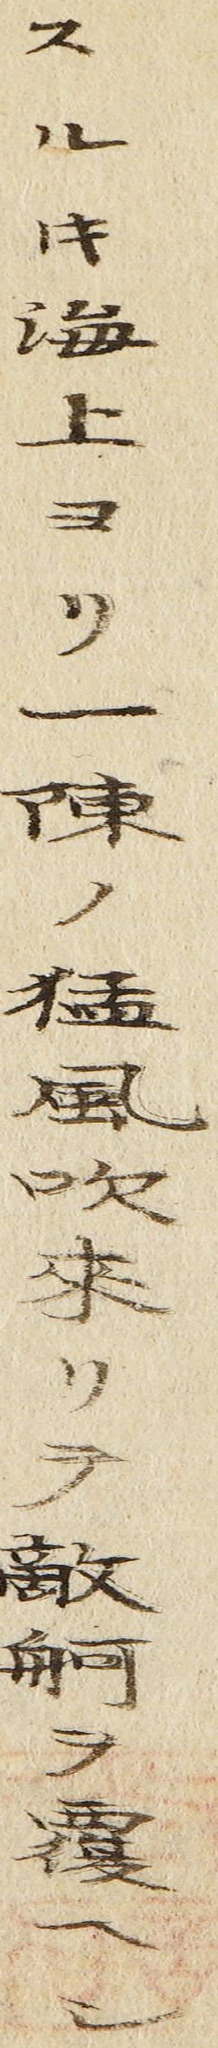スルトキ海上ヨリ一陳ノ猛風吹来リテ敵舸ヲ覆ヘシ
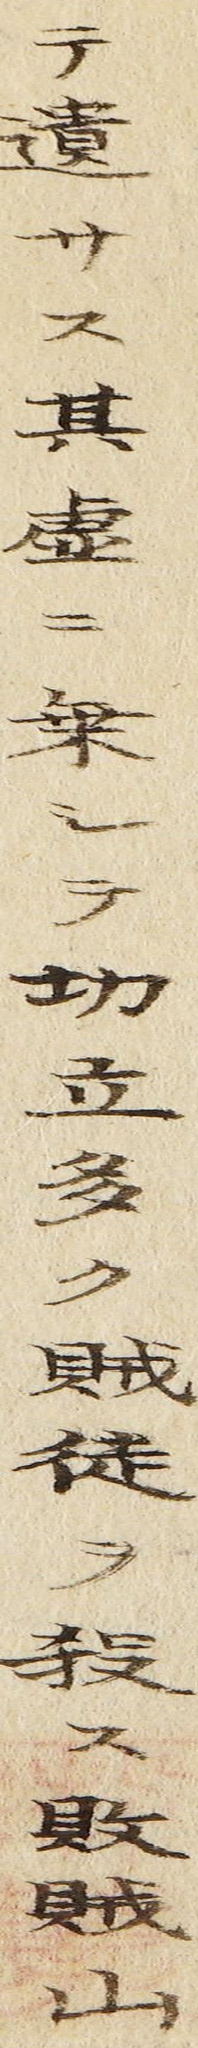テ遺サス其虚ニ乗シテ功立多ク賊徒ヲ殺ス敗賊山
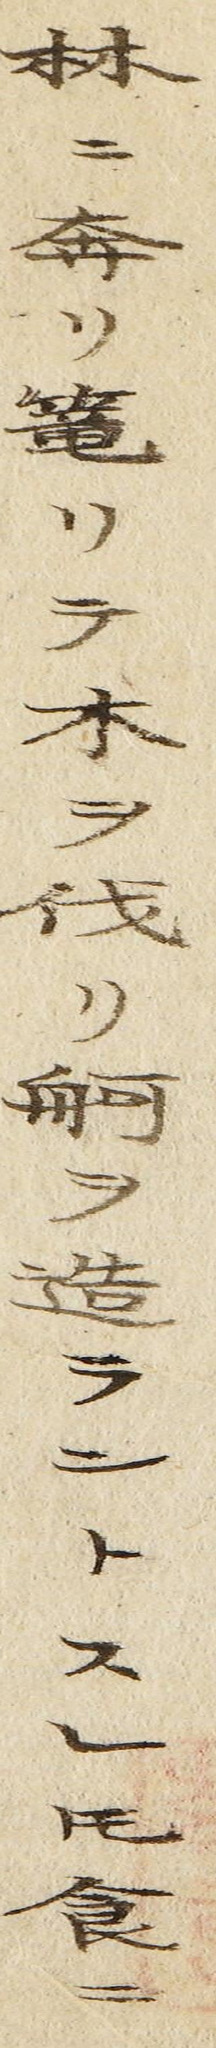林ニ奔リ篭リテ木ヲ伐リ舸ヲ造ラントスレトモ食ニ
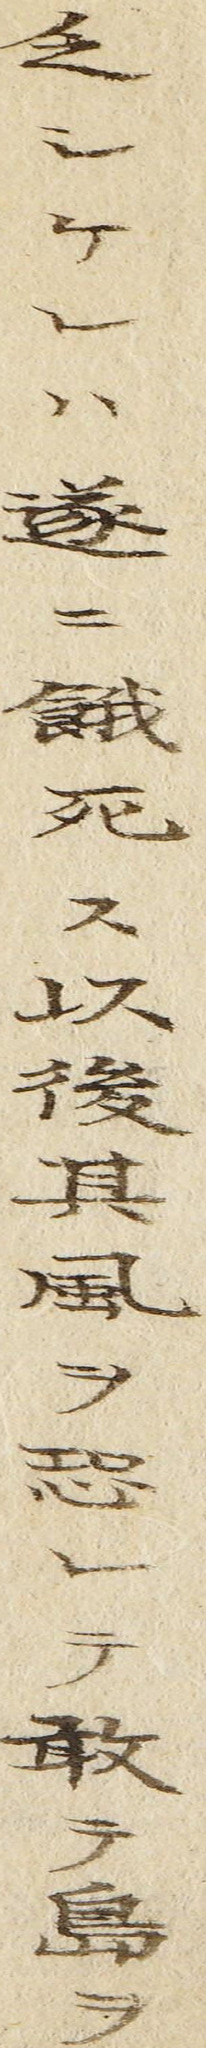乏シケレハ遂ニ餓死ス以後其風ヲ恐レテ敢テ島ヲ
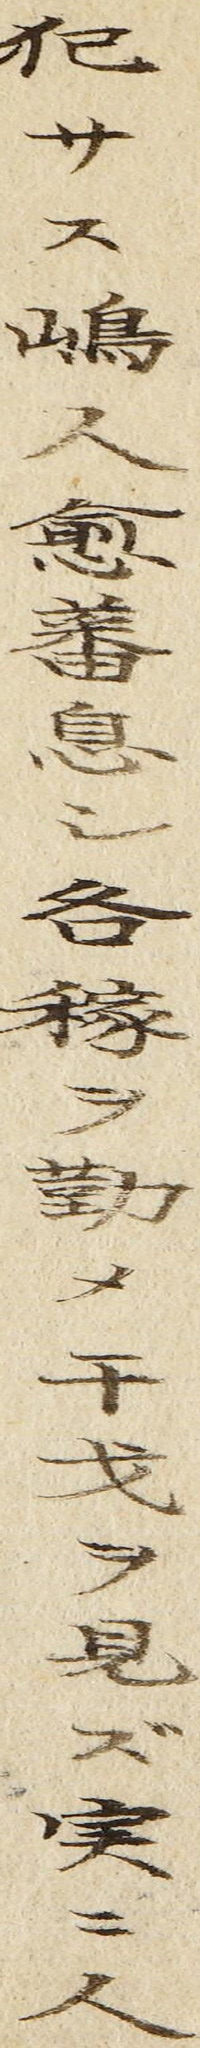犯サス嶋人愈蕃息シ各稼ヲ勤メ干戈ヲ見ズ実ニ人
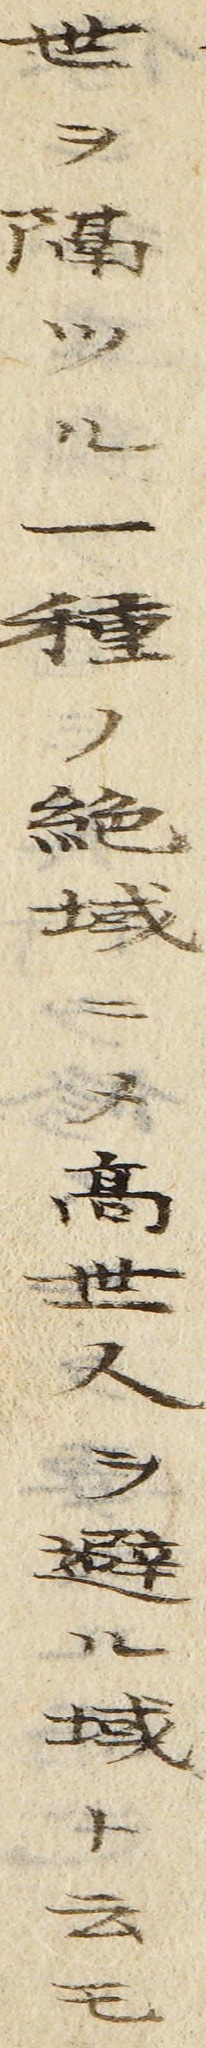世ヲ隔ツル一種ノ絶域ニシテ高世人ヲ避ル域ト云モ
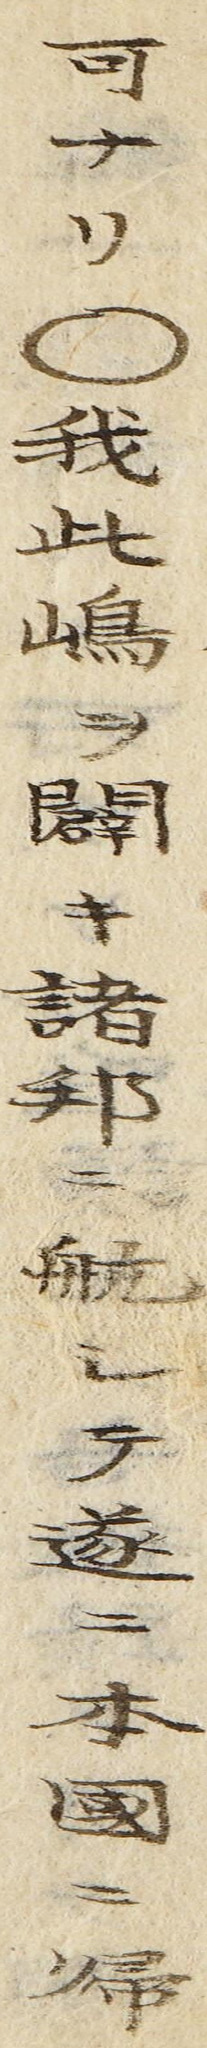可ナリ◯我此嶋ヲ闢キ諸邦ニ航シテ遂ニ本国ニ帰
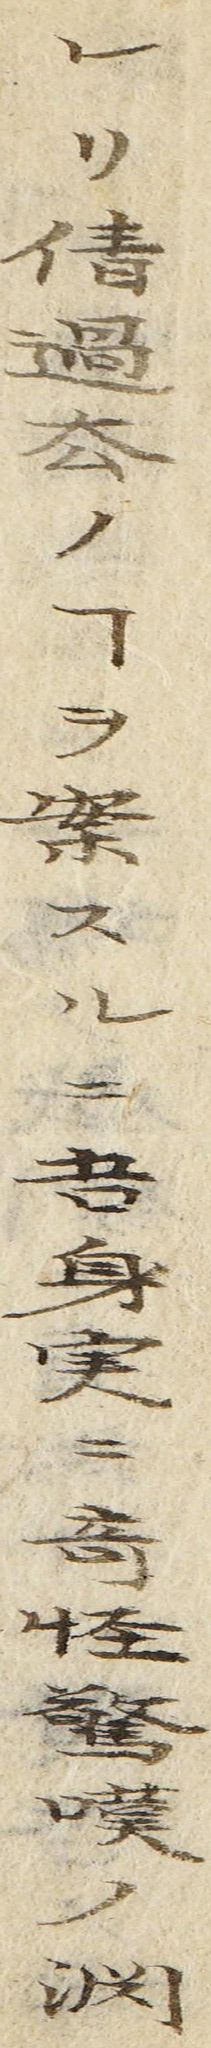レリ倩過去ノコトヲ案スルニ吾身実ニ奇怪驚嘆ノ淵
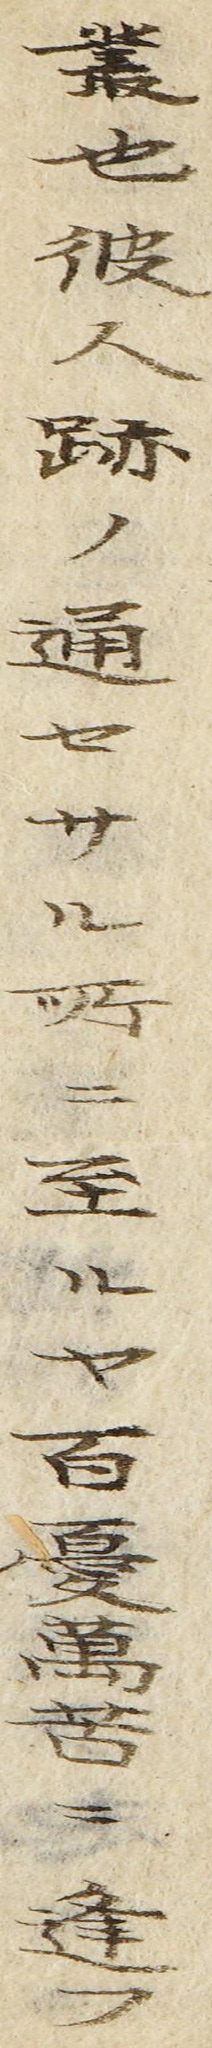叢也彼人跡ノ通セサル所ニ至ルヤ百憂萬苦ニ逢フ
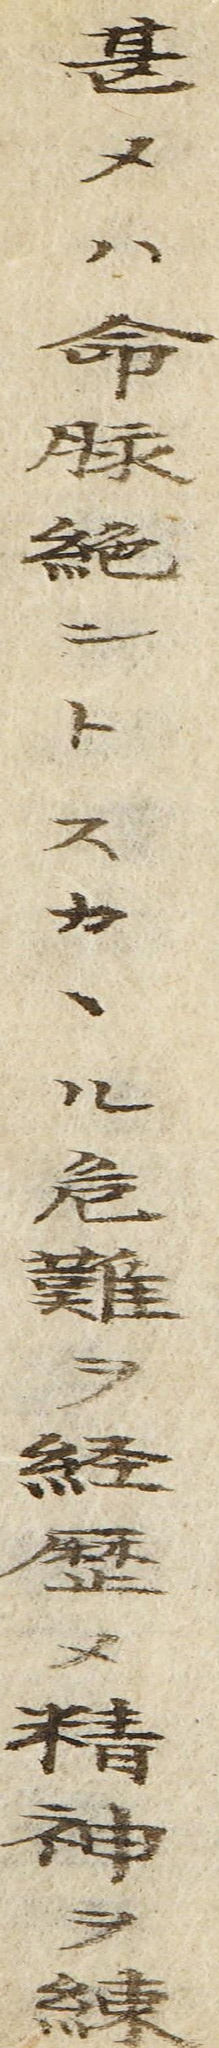甚シテハ命脈絶ントスカヽル危難ヲ経歴シテ精神ヲ練
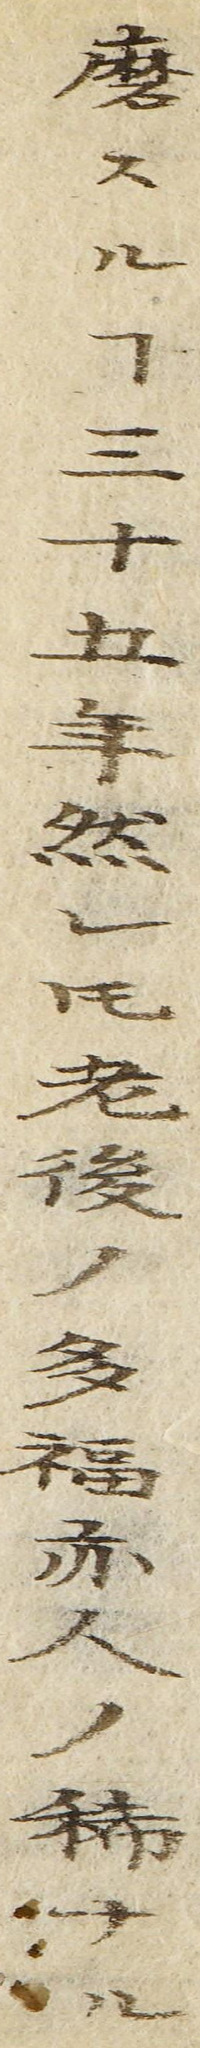磨スルコト三十五年然レトモ老後ノ多福亦人ノ稀ナル
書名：漂流紀事
